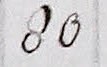80
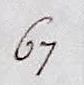67
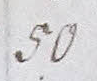50
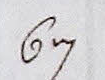67
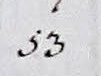53
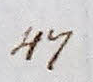47
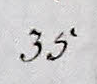35
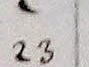23
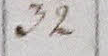32
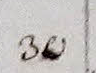30
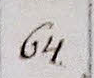64.
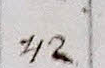42
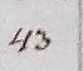43
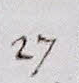27
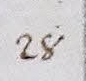28
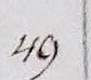49
